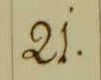21.
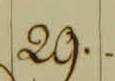29.
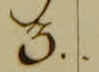3.
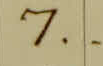7.
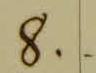8.
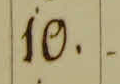10.
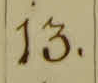13
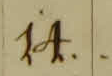14.
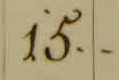15.
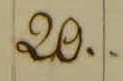20.
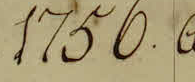1756.
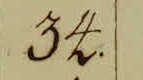34.
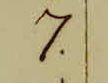7.
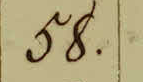58.
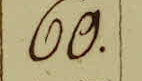60.
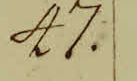47.
